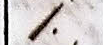1.
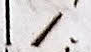1
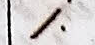1.
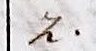2
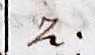2
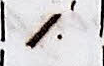1.
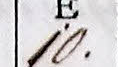10.
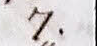7.
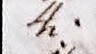4
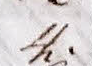4
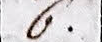6.
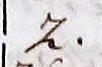2.
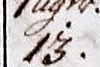13
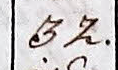32
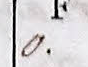0.
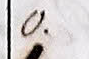0.
